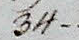34
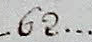62
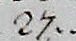27
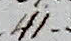41
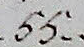55
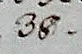38
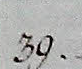39
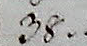38
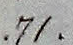71
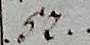52
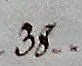38
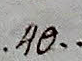40
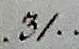31
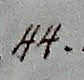44
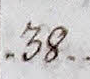38
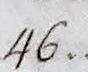46
